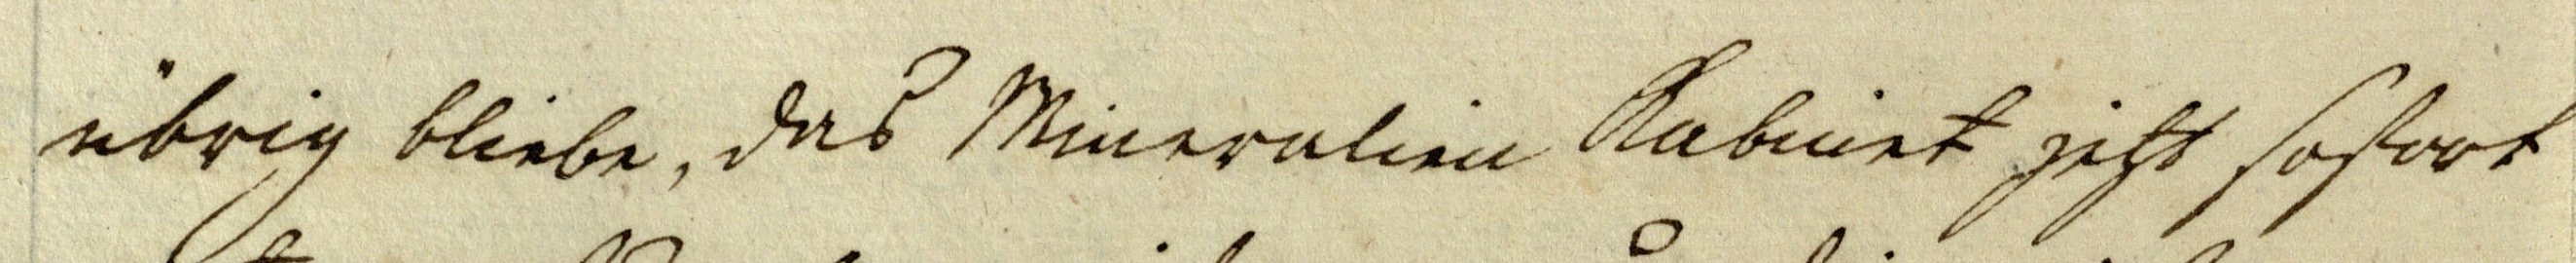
übrig bliebe, das Mineralien Kabinet jetzt sofort
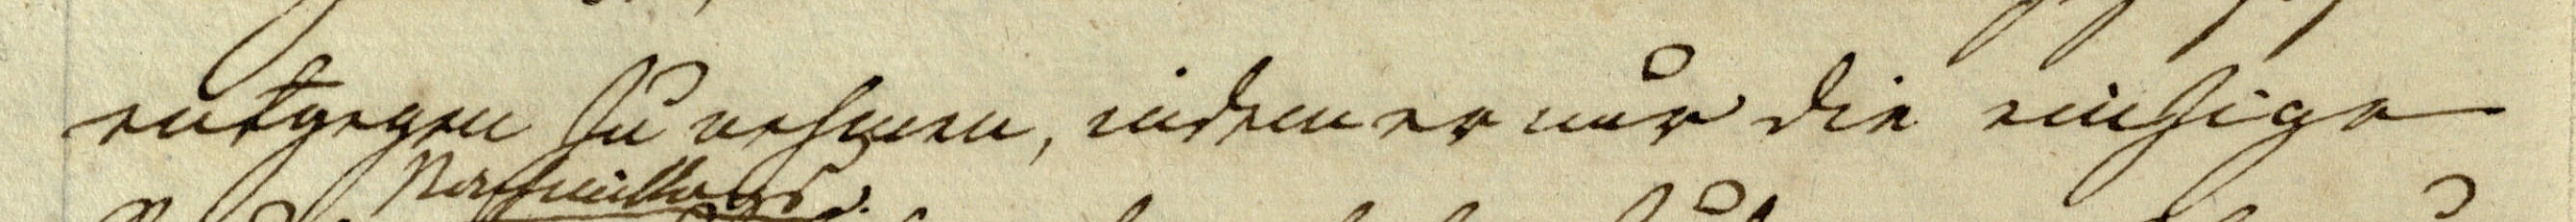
entgegen zu nehmen, indem er nur die einzige
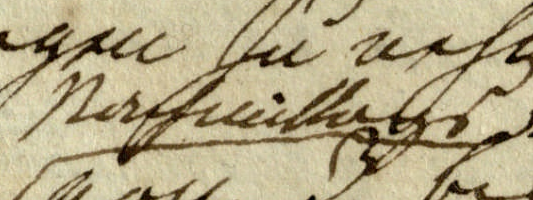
Nachmittags
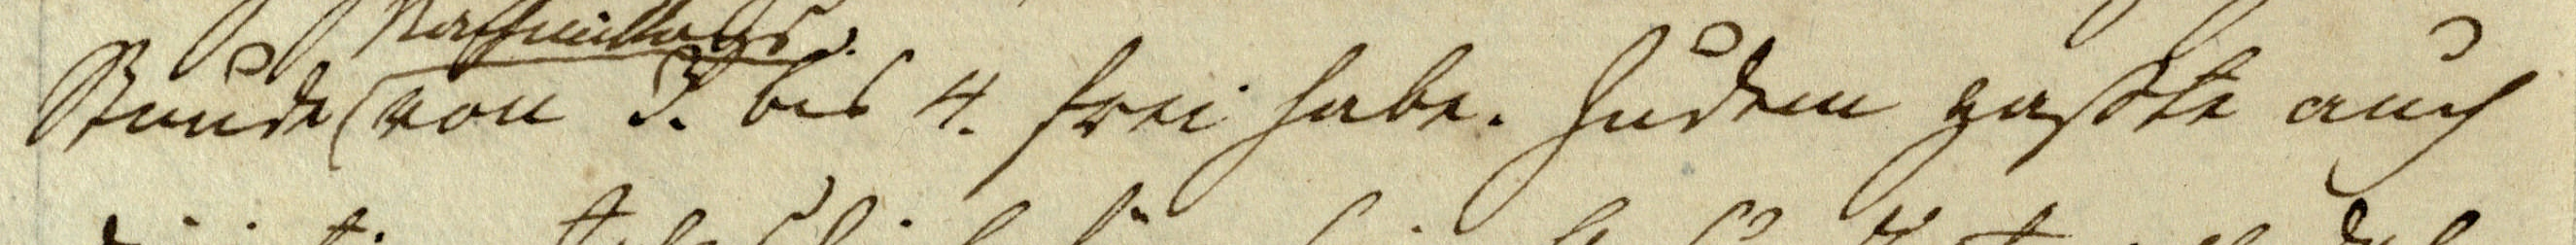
Stunde, von 3. bis 4. frei habe. Zudem paßte auch
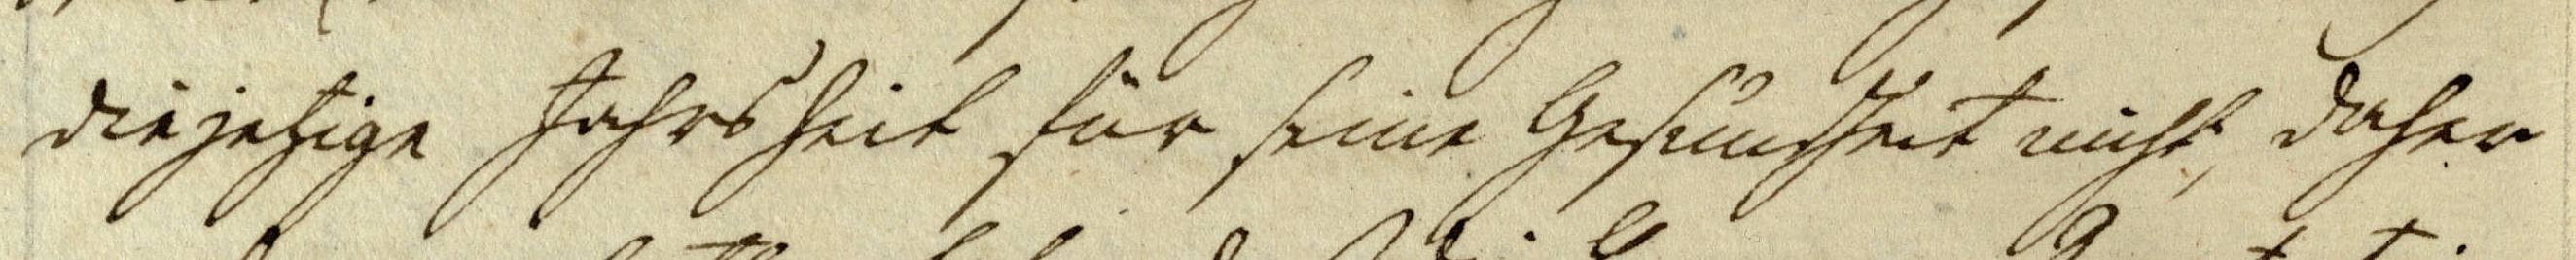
die jetzige Jahrszeit für seine Gesundheit nicht, daher
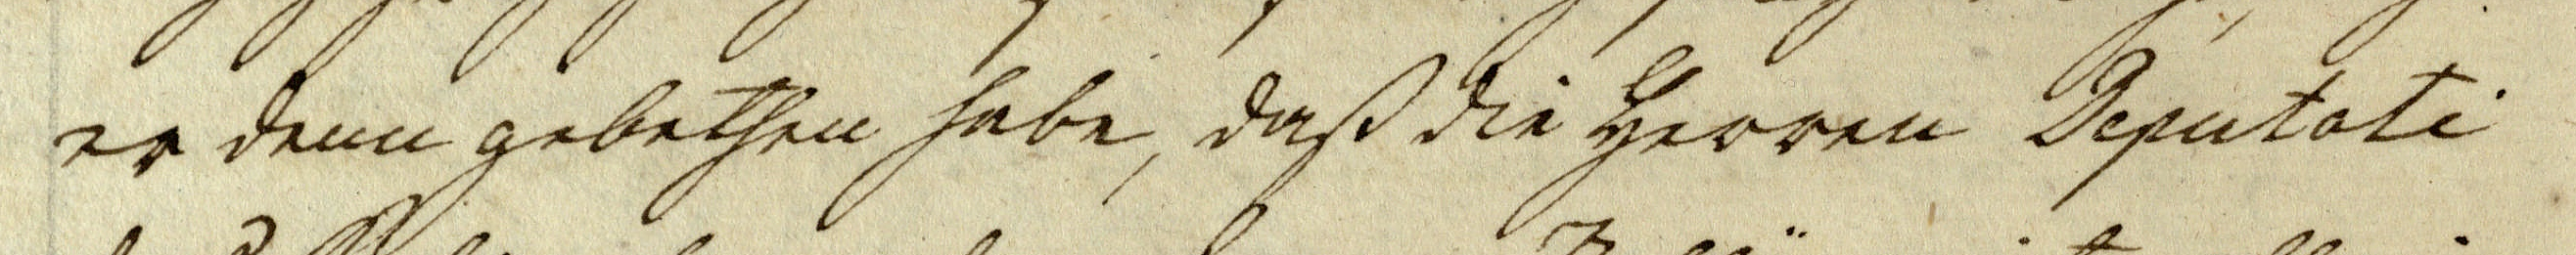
er denn gebethen habe, daß die Herren Deputati
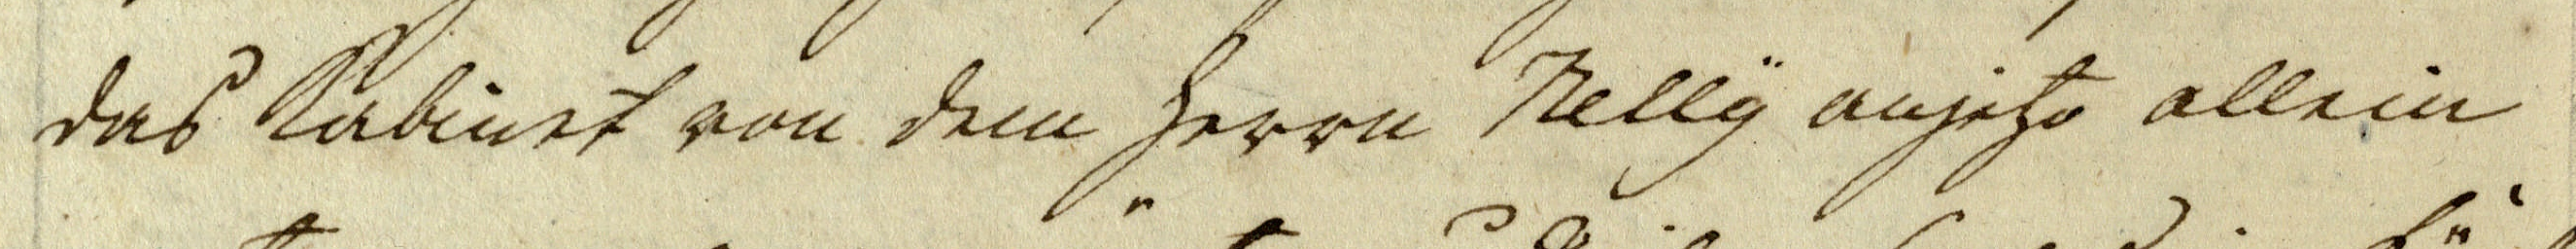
das Kabinet von dem Herrn Nellÿ anjetzo allein
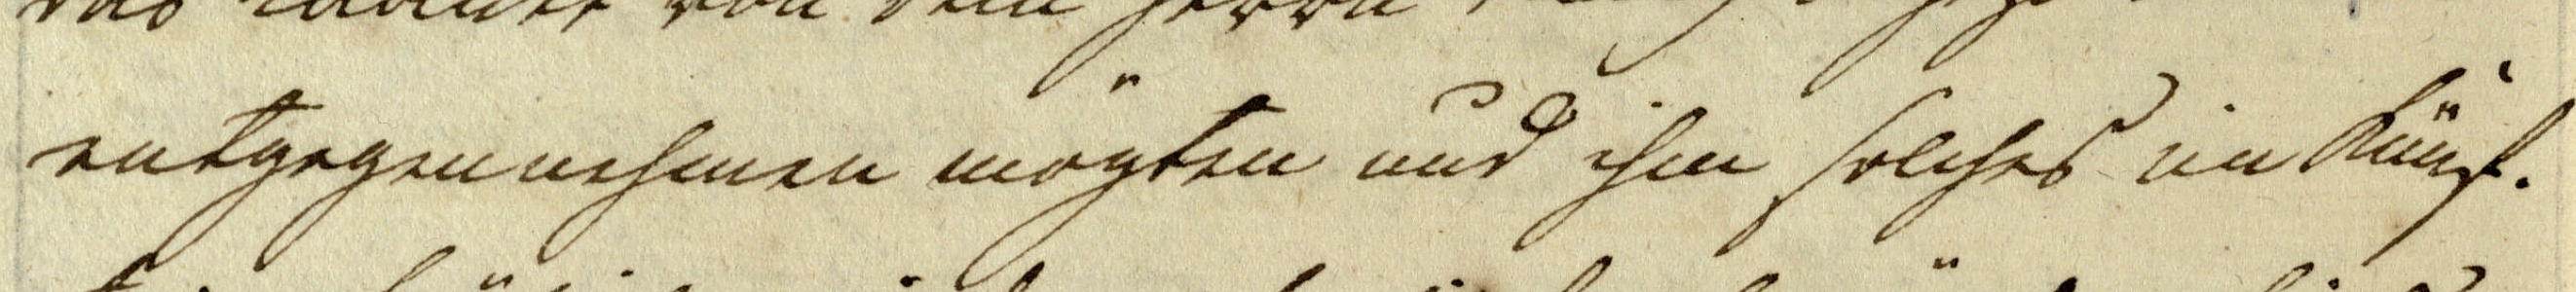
entgegennehmen mögten und ihm solches im künf¬
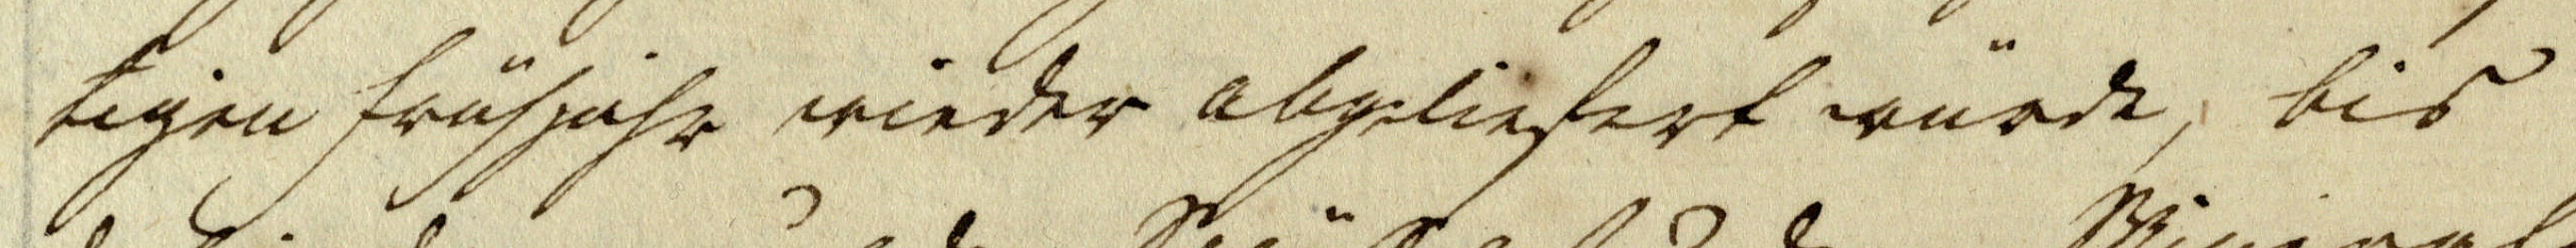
tigen Frühjahr wieder abgeliefert würde, bis
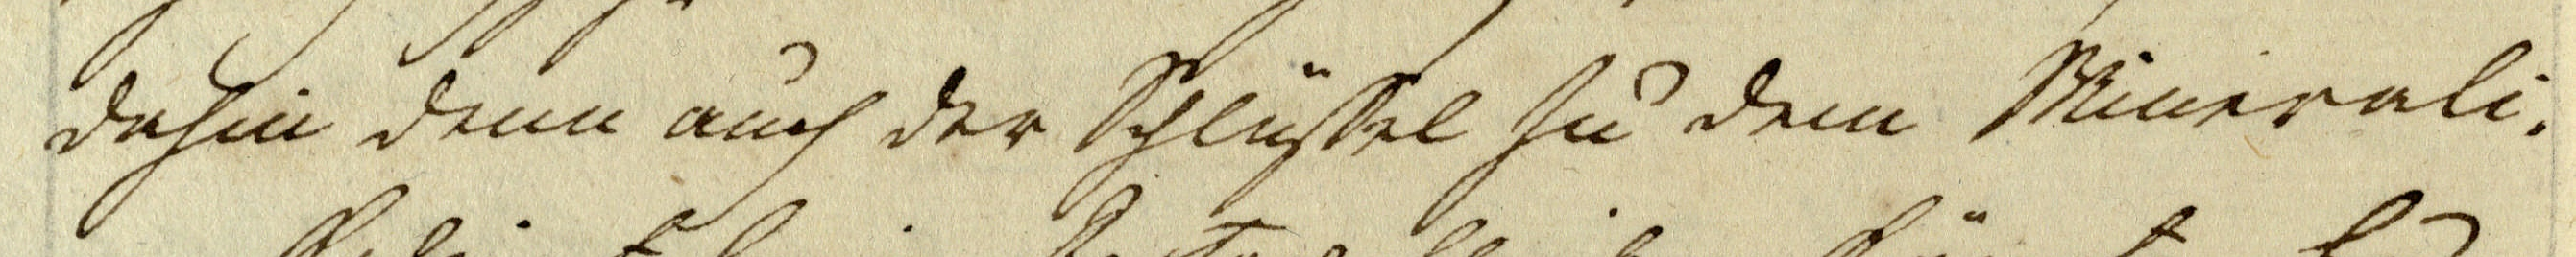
dahin denn auch der Schlüssel zu dem Minerali¬
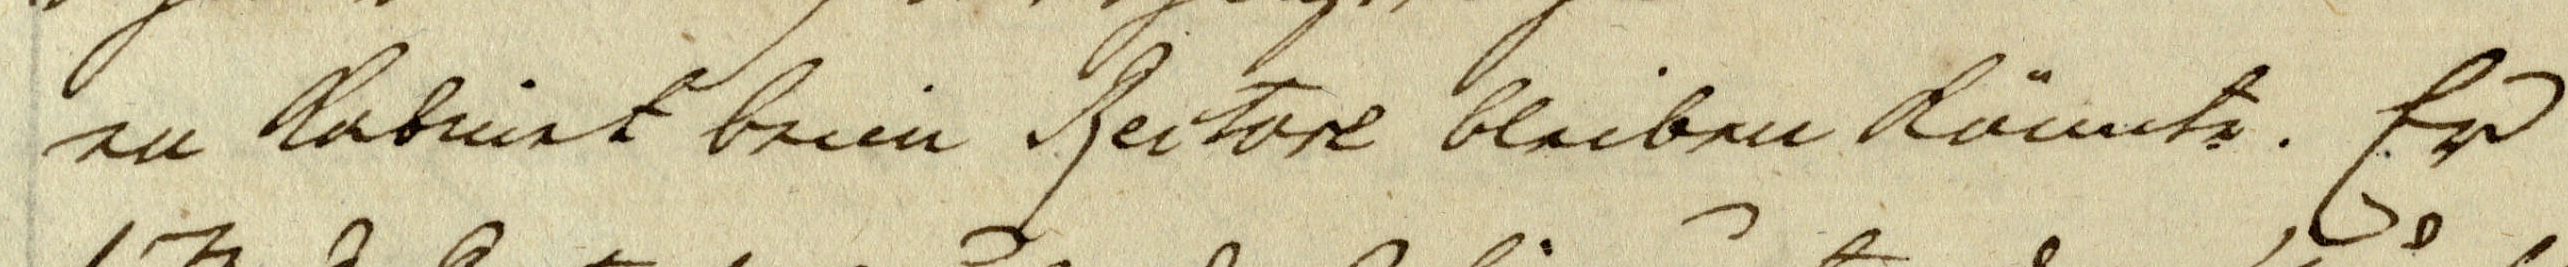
en Kabinet beim Rectore bleiben könnte. Er
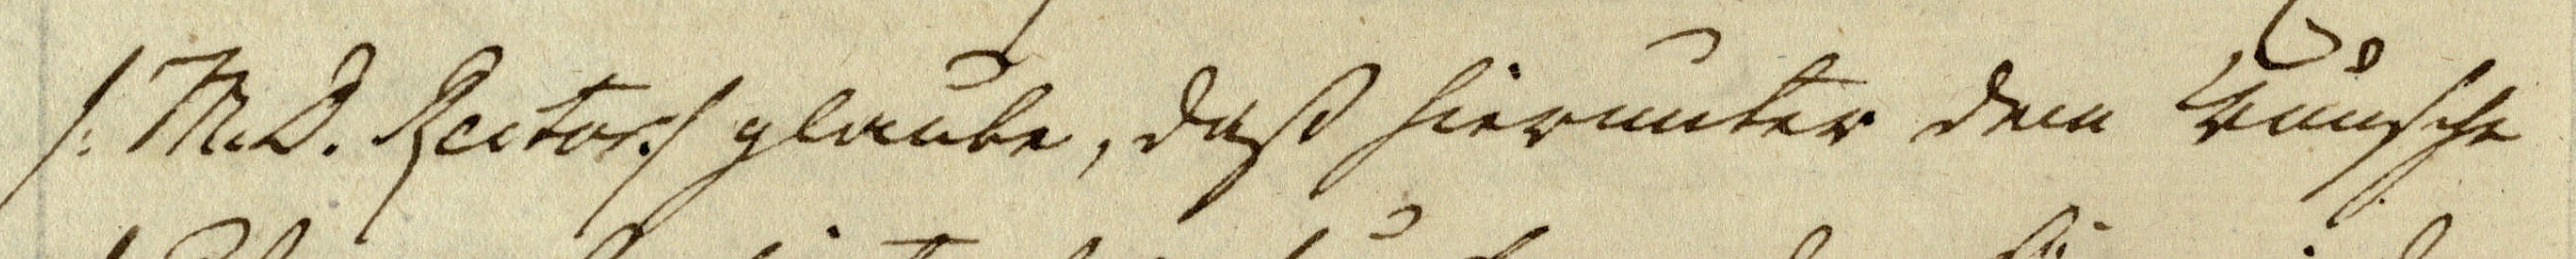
/: M. D. Rector :/ glaube, daß hierunter dem Wunsche
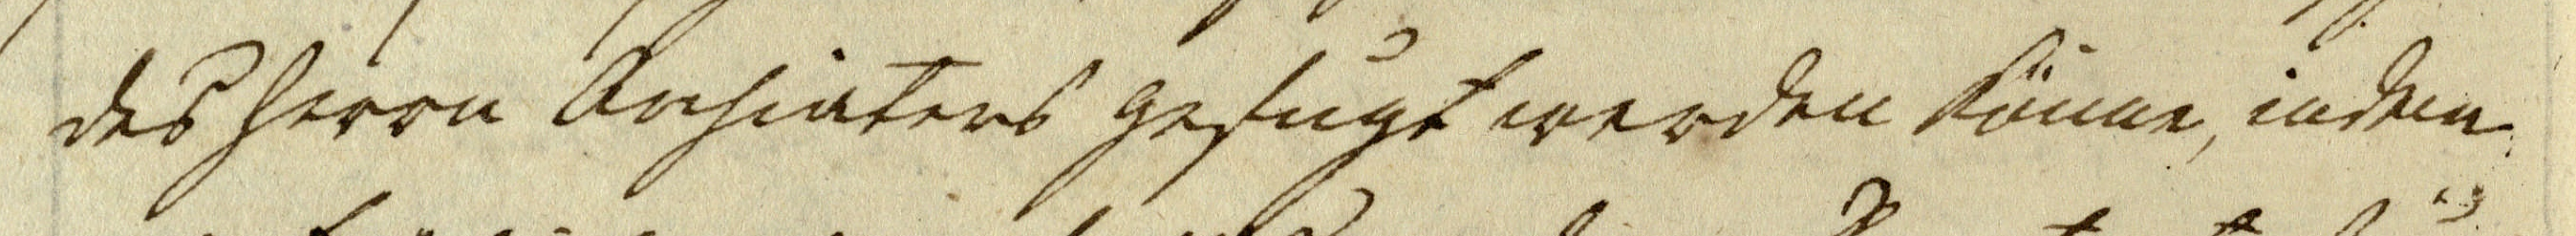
des Herrn Archiaters gefügt werden könne, indem
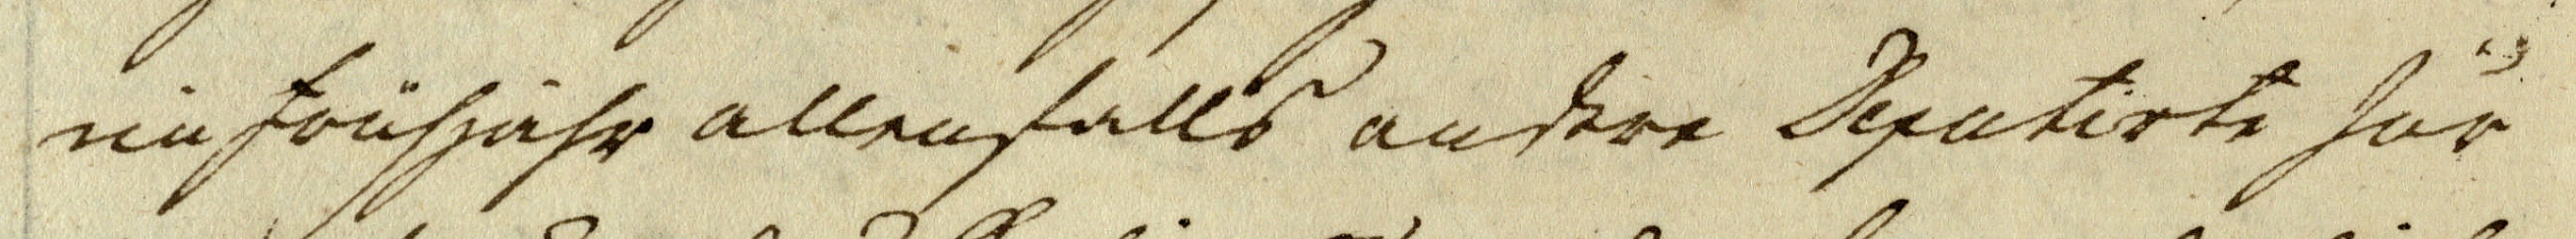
im Frühjahr allenfalls andere Deputirte zur
